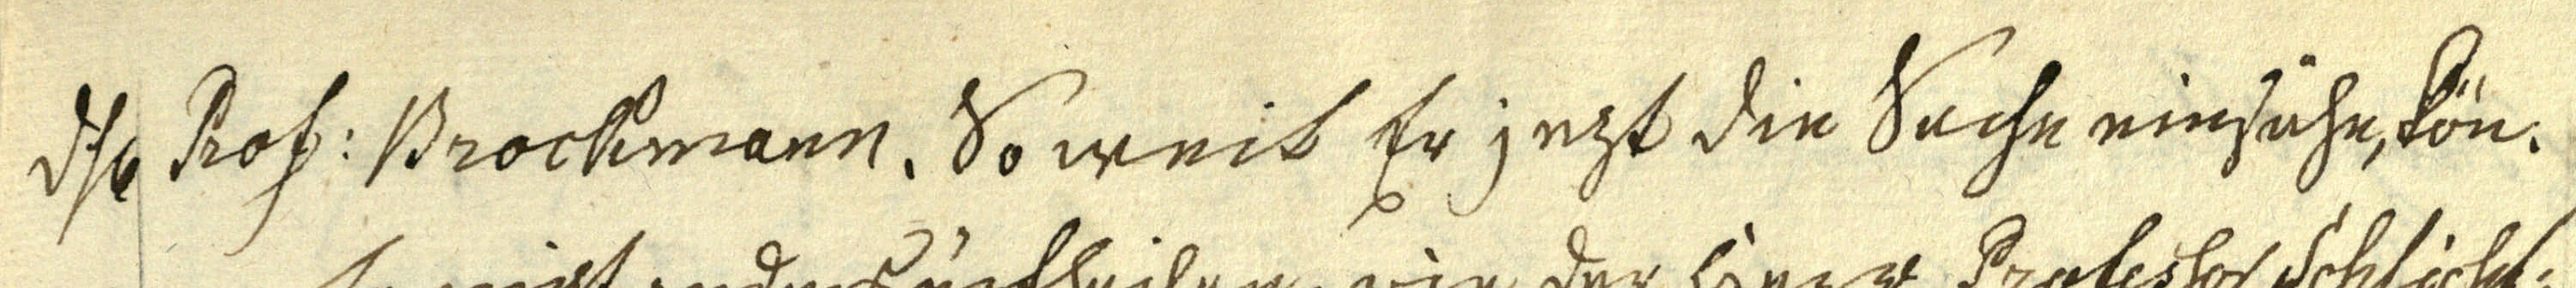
dh Prof. Brockmann. So weit Er jezt die Sache einsähe kön¬
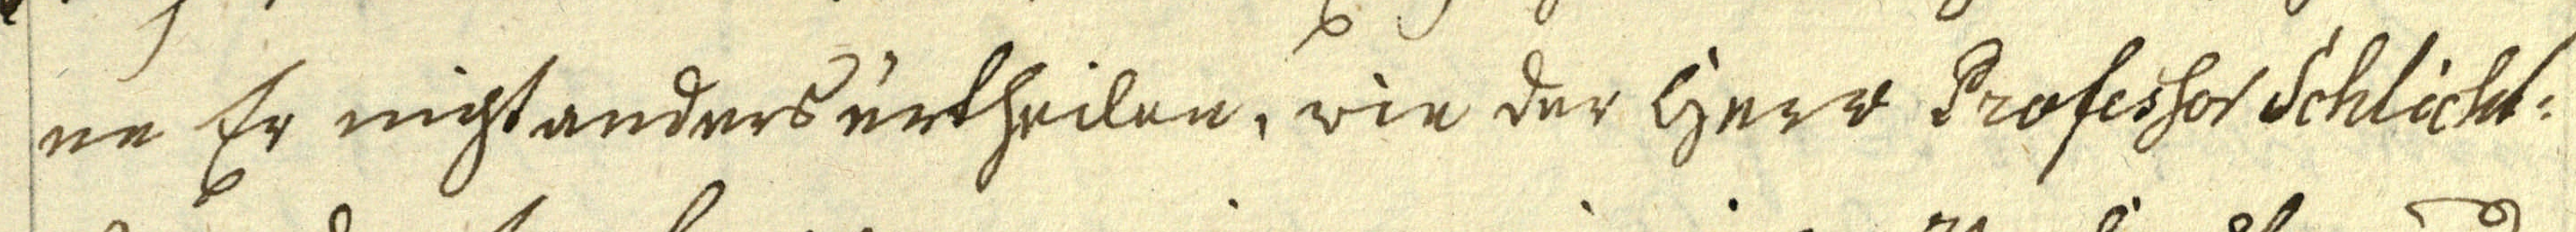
ne Er nicht anders urtheilen, wie der Herr Professor Schlicht¬
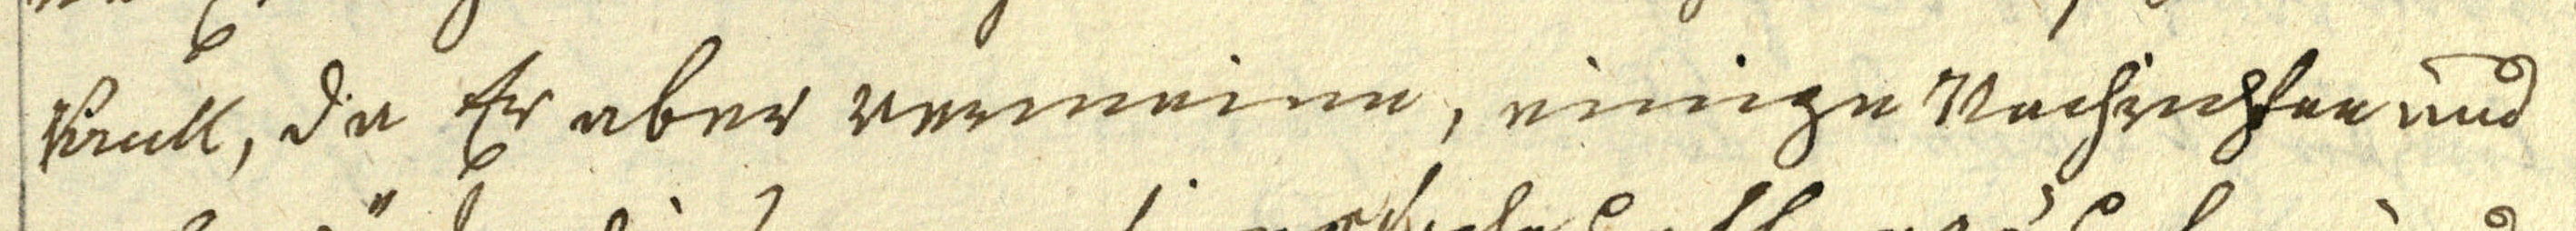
krull, da Er aber vermeine, einige Nachrichten und
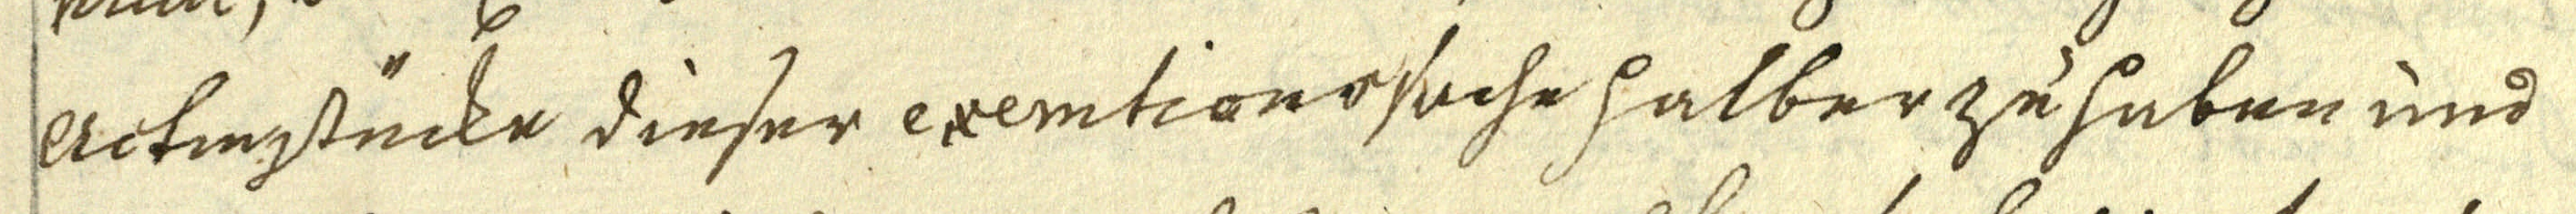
Actenstücke dieser exemtionssache halber zu haben und
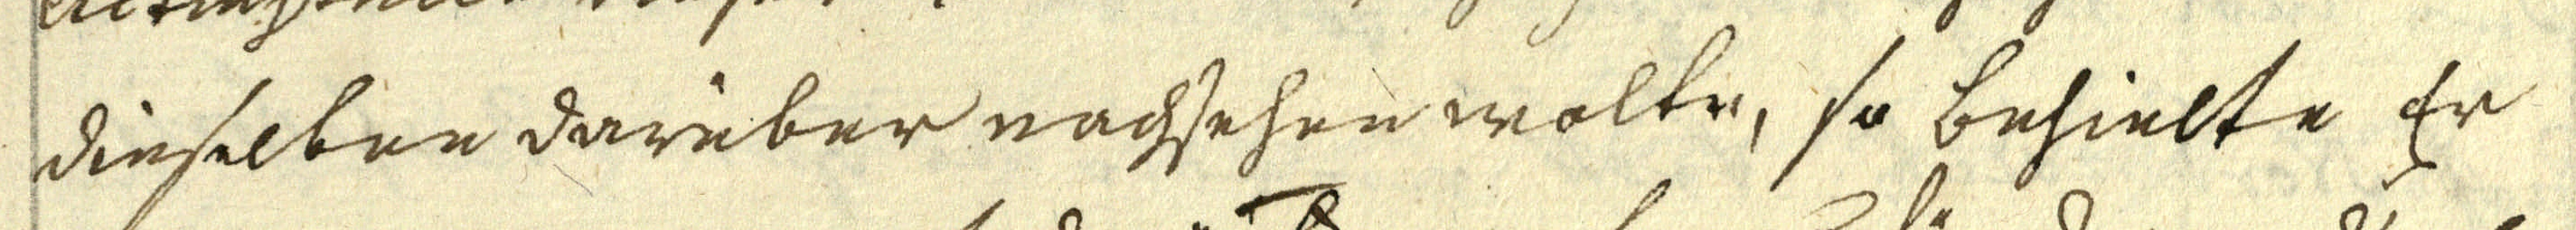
dieselben darüber nachsehen wolte, so behielte Er
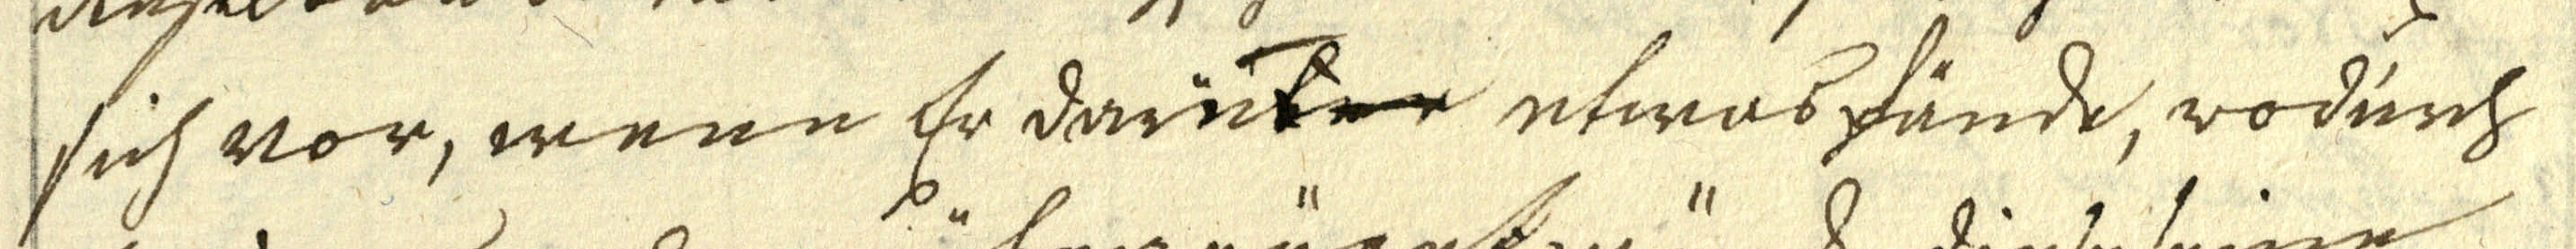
sich vor, wenn Er darüber etwas fände, wodurch
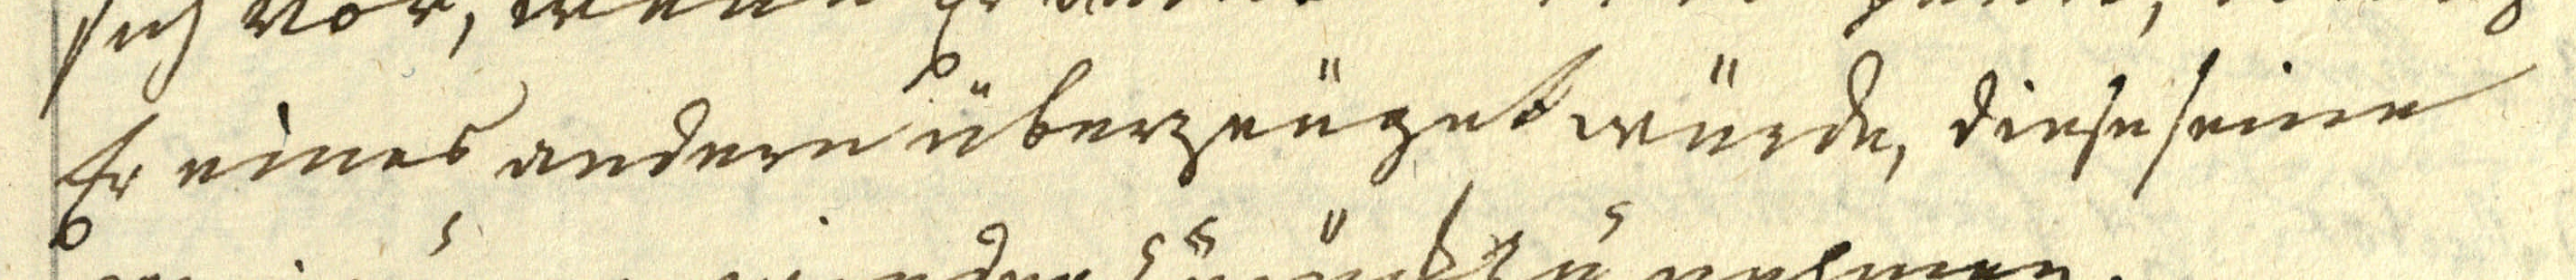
Er eines andern überzeuget würde, diese seine
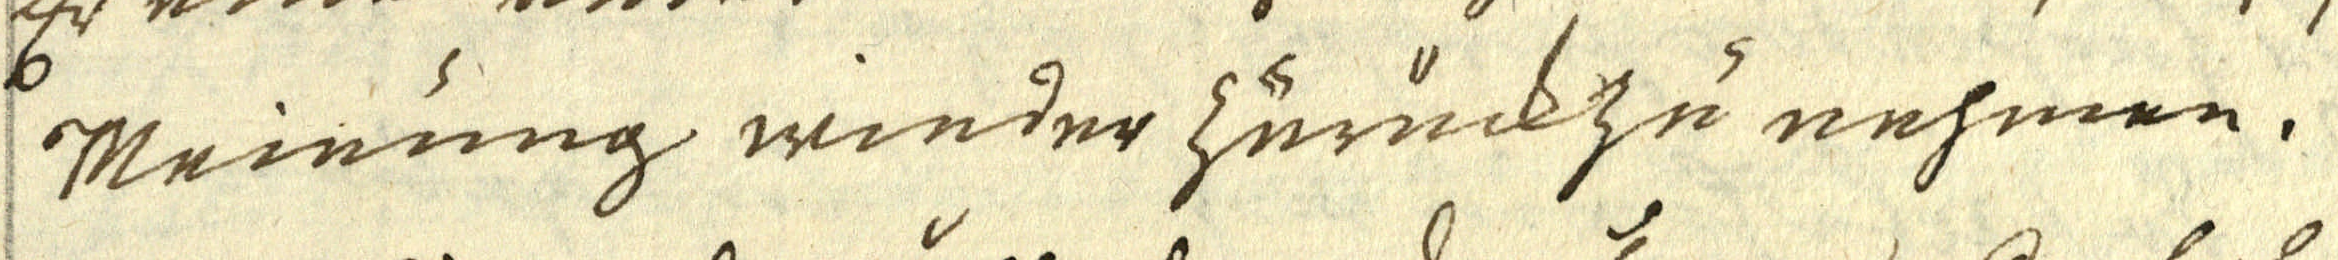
Meinung wieder zurückzunehmen.
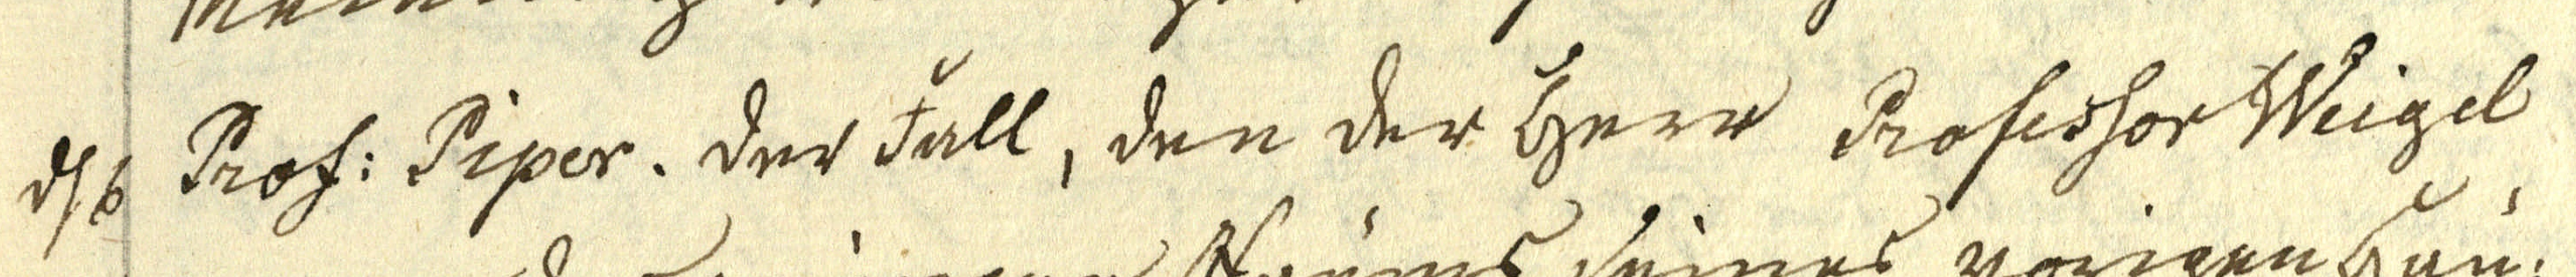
dh. Prof. Piper. Der Fall, den der Herr Professor Weigel
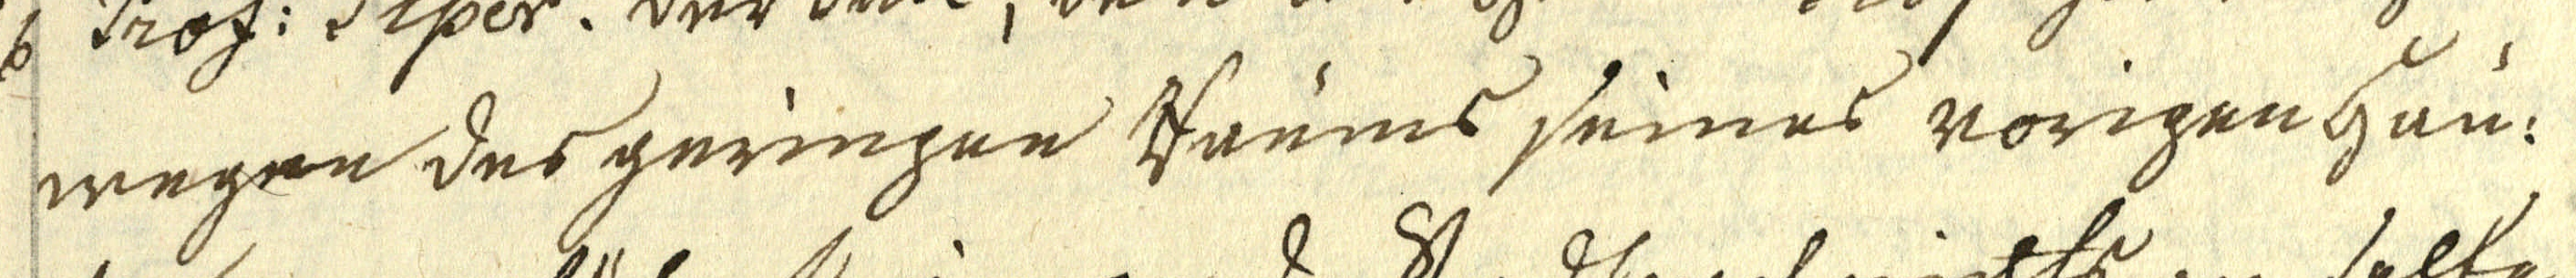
wegen des geringen Raums seines vorigen Hau¬
